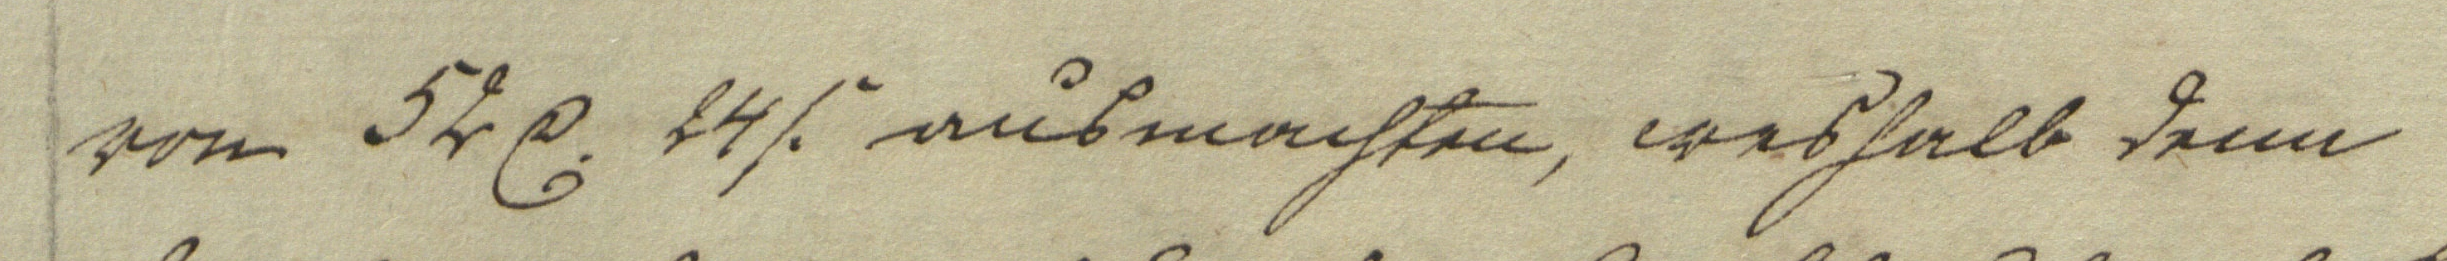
von 52. l. 24 s. ausmachten, weshalb denn
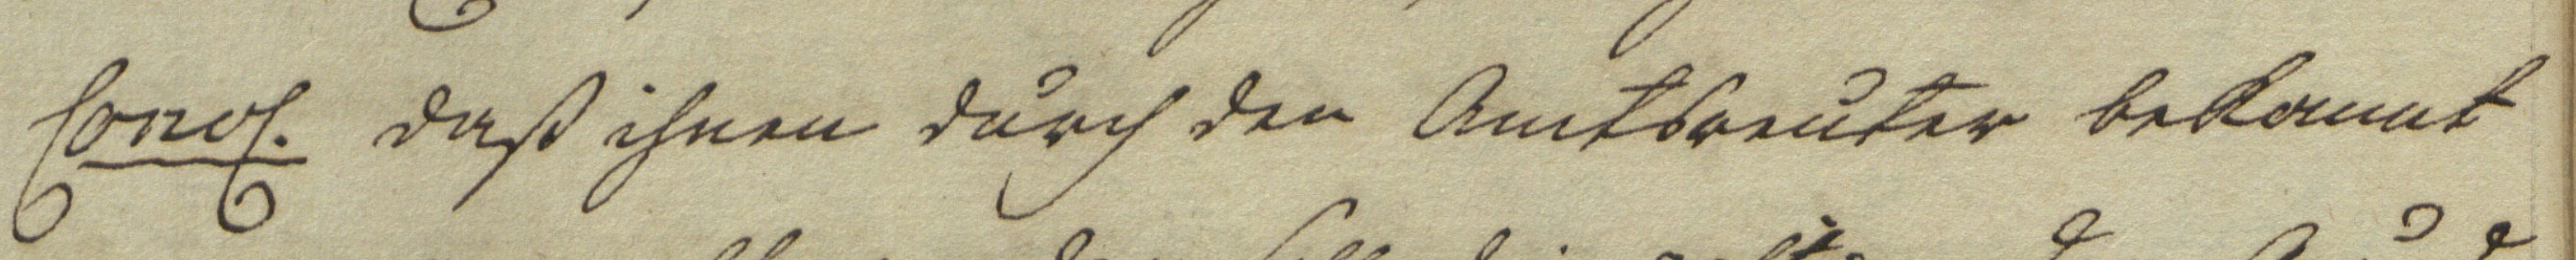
Concl. daß ihnen durch den Amtreuter bekannt
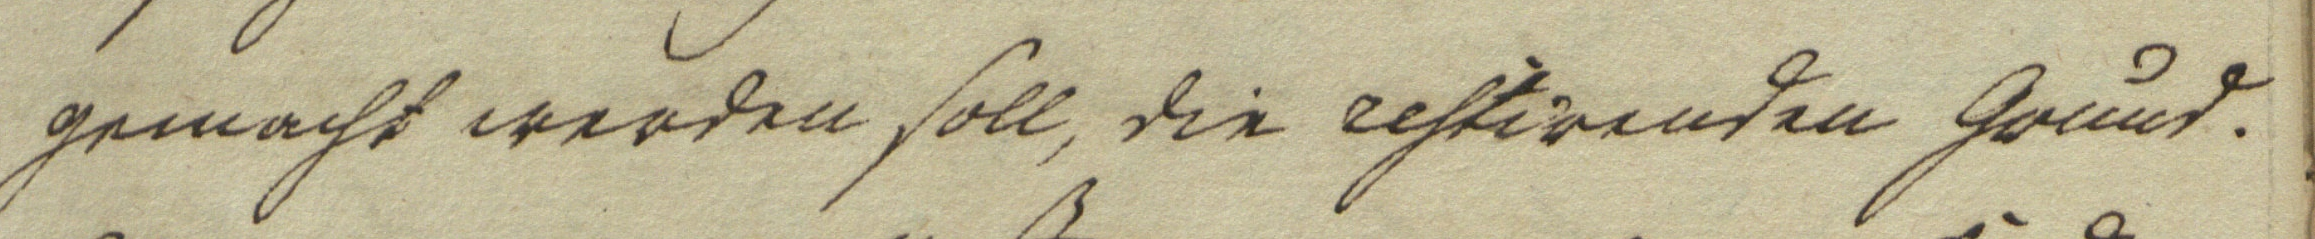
gemacht werden soll, die restirenden Grund¬
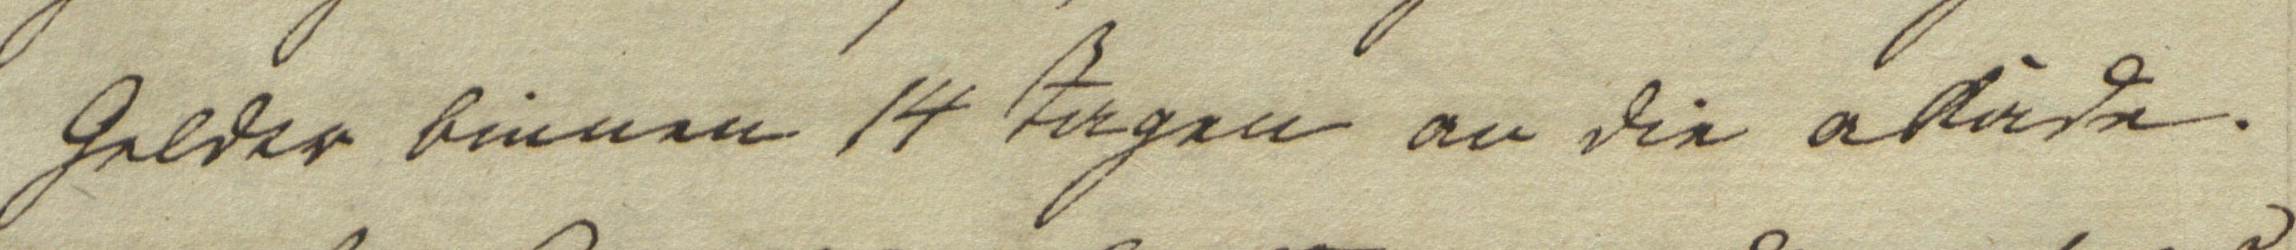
Gelder binnen 14 Tagen an die akade¬
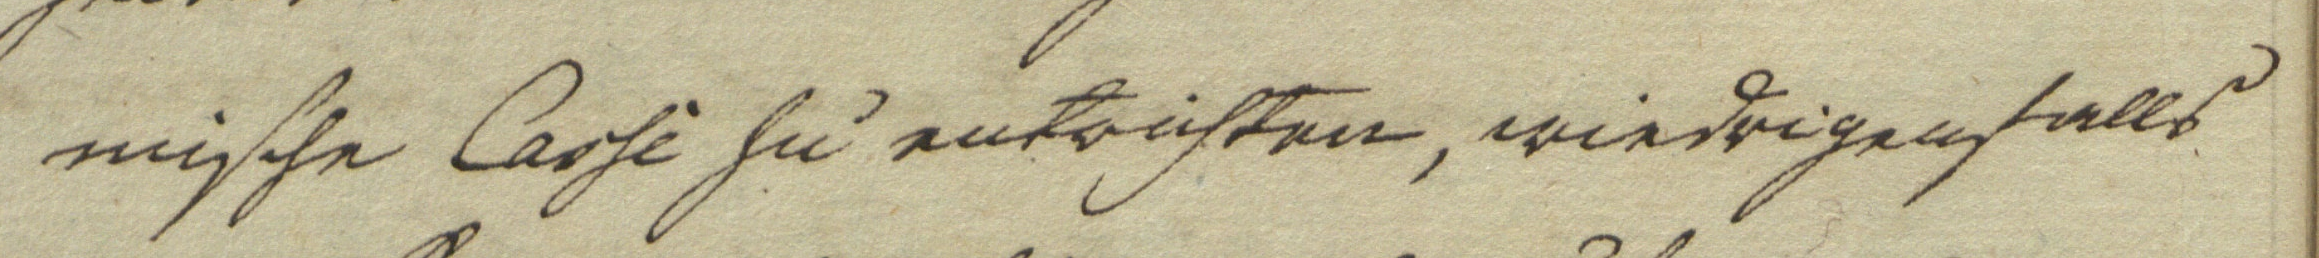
mische Casse zu entrichten, wiedrigenfalls
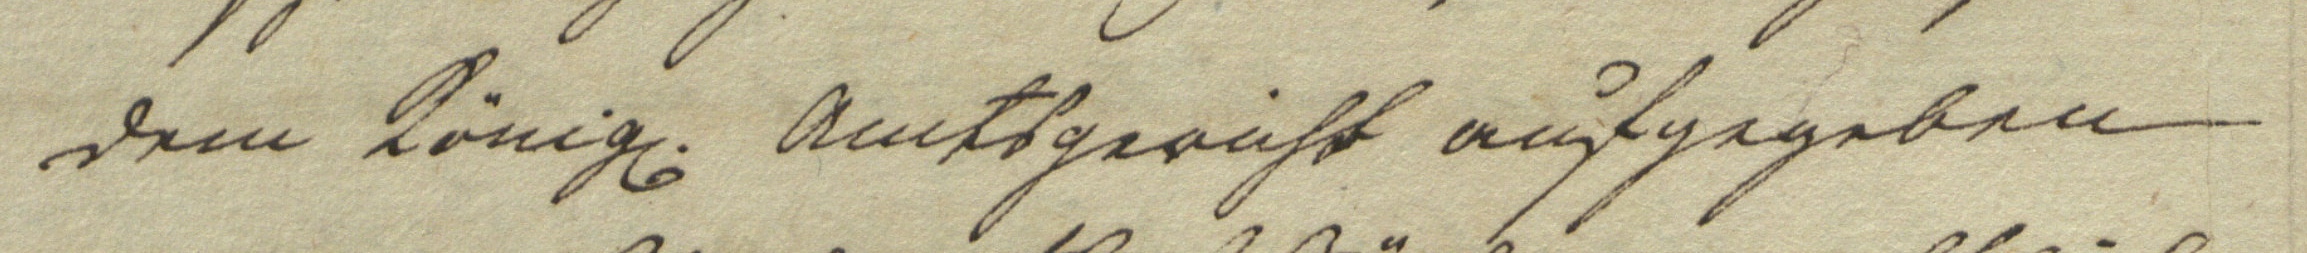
dem Königl. Amtsgericht aufgegeben
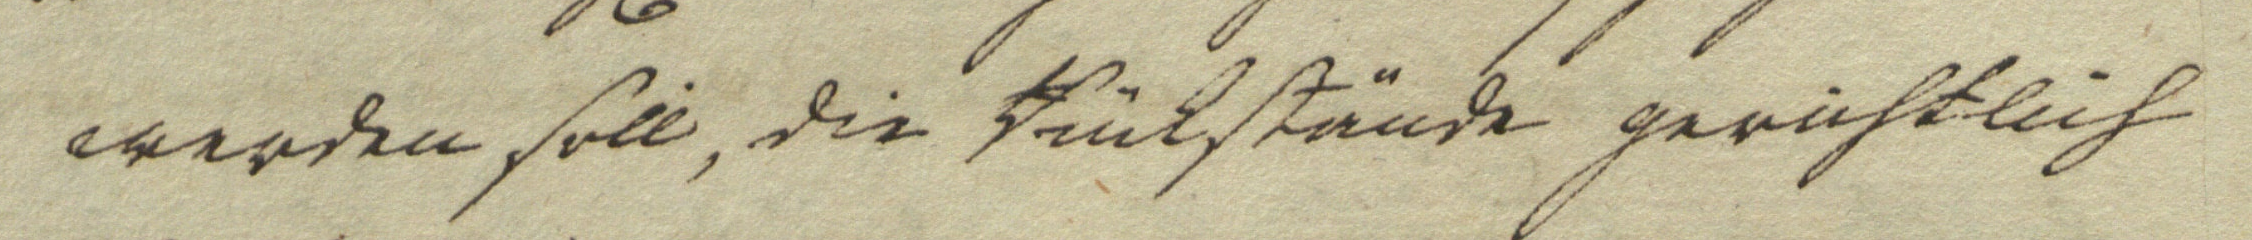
werden soll, die Rückstände gerichtlich
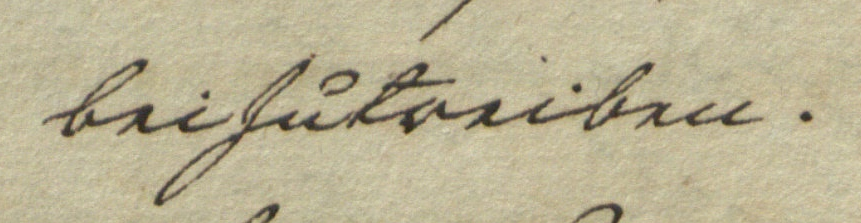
beizutreiben.
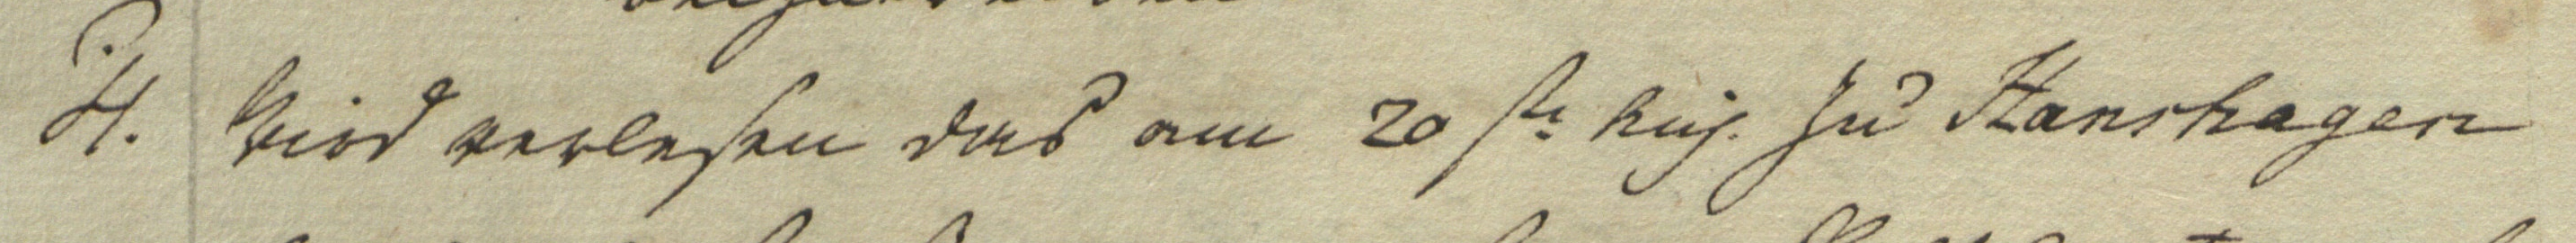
4. Wird verlesen das am 20 t huj. zu Hanshagen
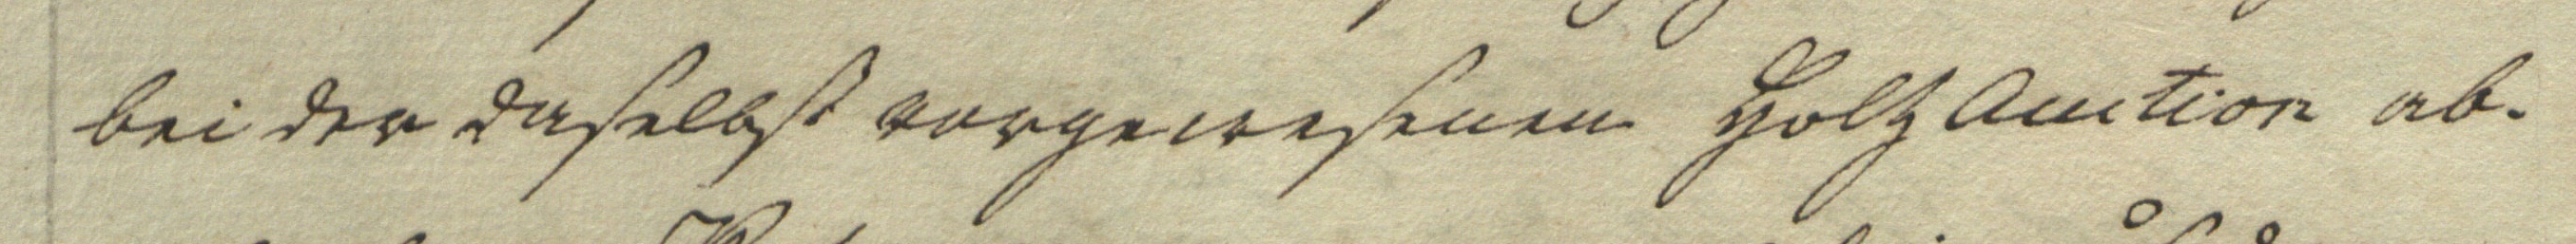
bei der daselbst vorgewesenen Holz Auction ab¬
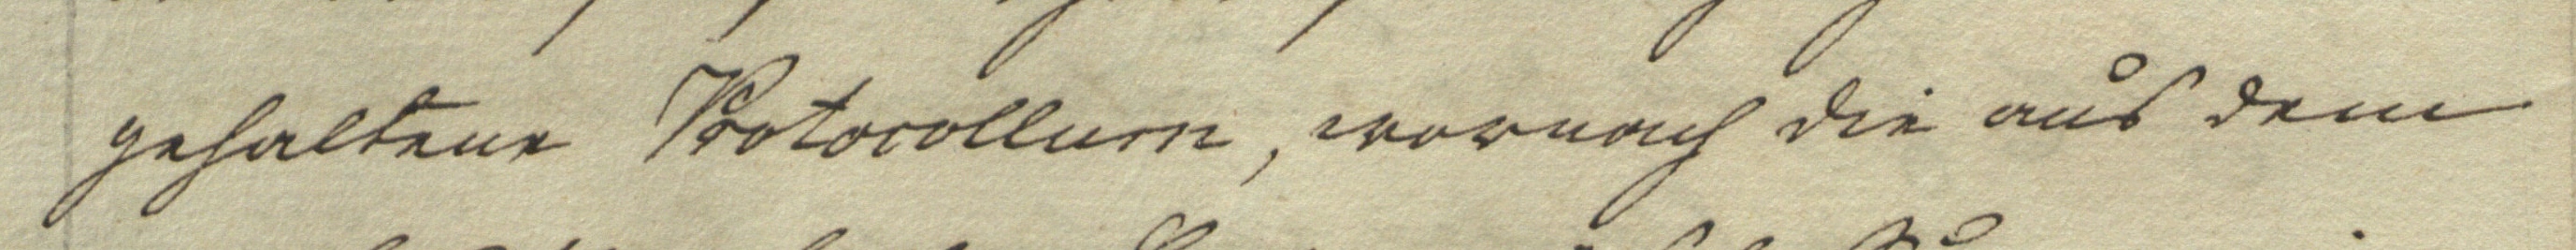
gehaltene Protocollum, wornach die aus dem
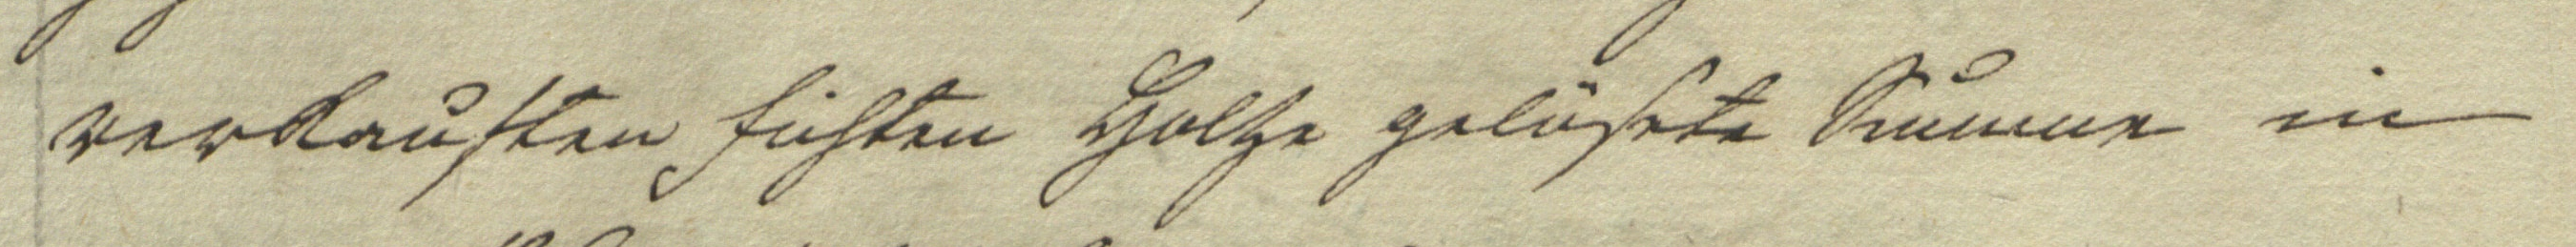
verkauften Fichten Holze gelösete Summe in
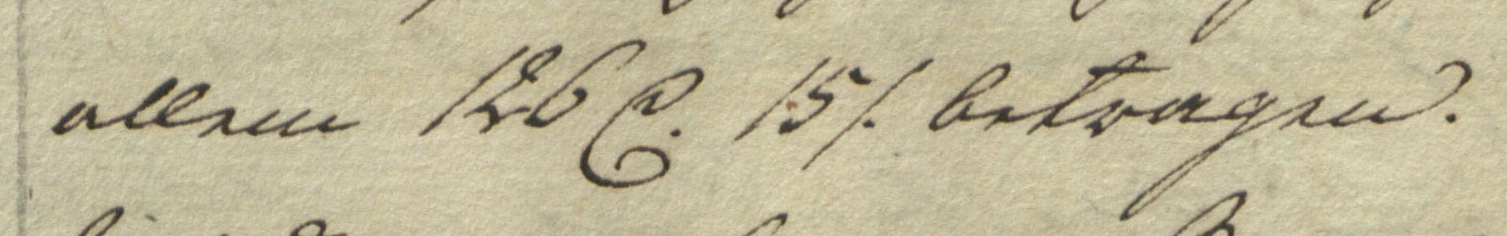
allem 125 l. 15 s. betragen.
